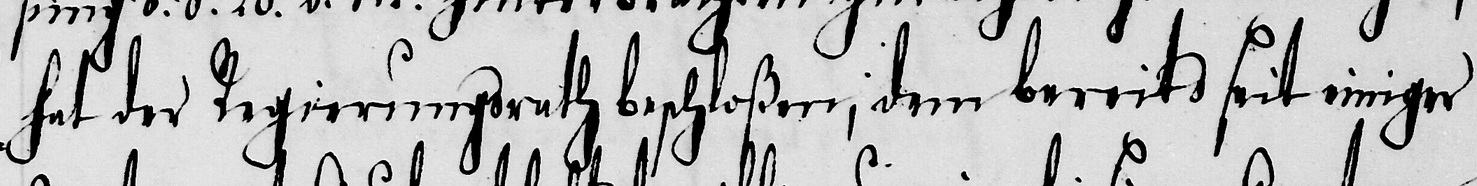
hat der Regierungsrath beschloßen, dem bereits seit einiger
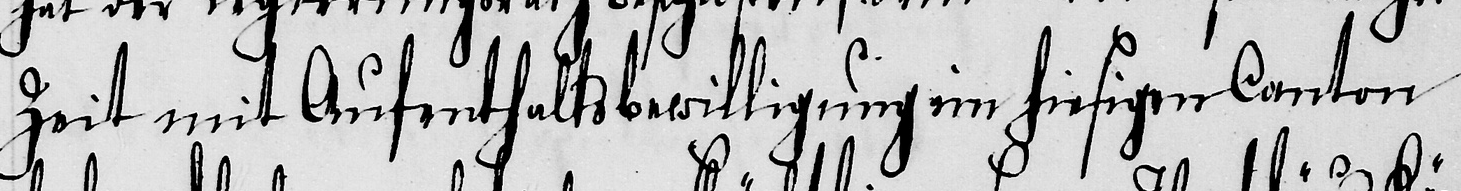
Zeit mit Aufenthaltsbewilligung im hiesigen Canton
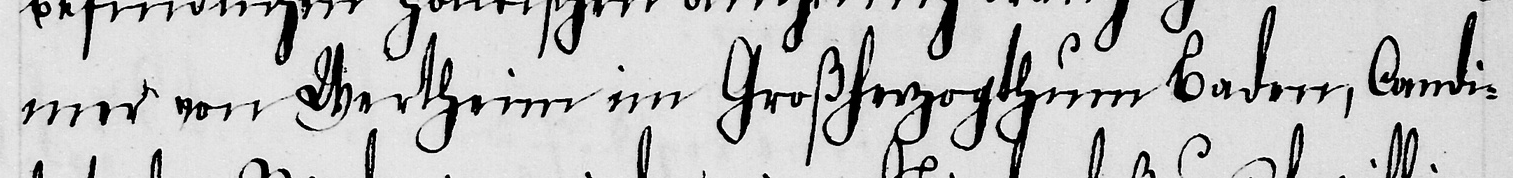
mer von Wertheim im Großherzogthum Baden, Candi¬
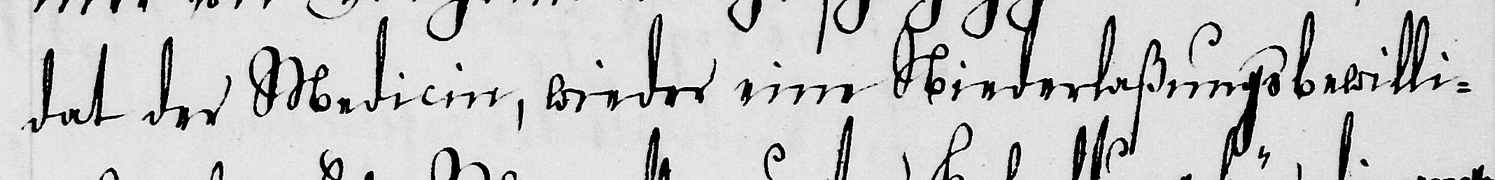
dat der Medicin, wieder eine Niederlaßungsbewilli¬
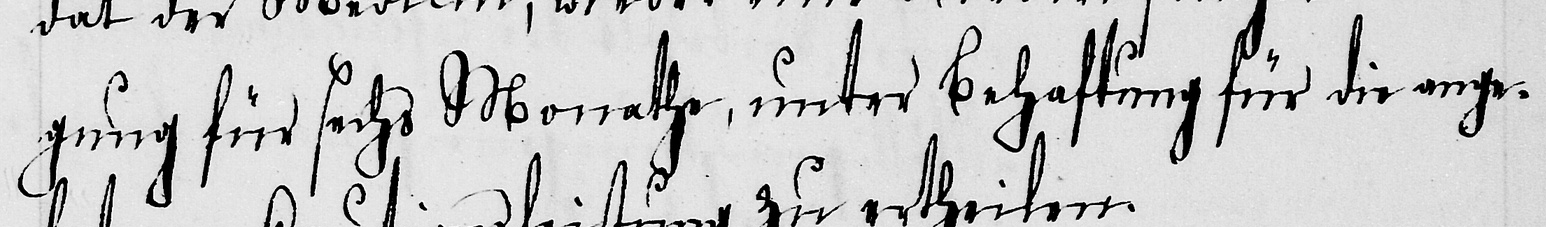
gung für sechs Monathe, unter Behaftung für die ange¬
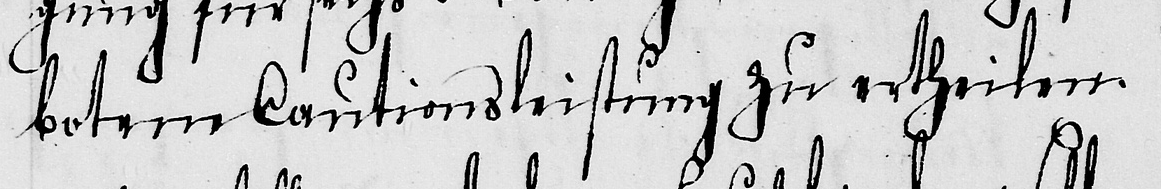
botene Cautionsleistung zu ertheilen.
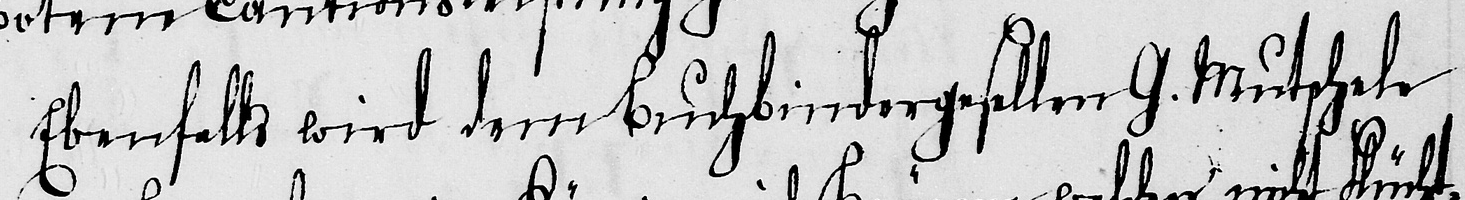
Ebenfalls wird dem Buchbindergesellen G. Mutschele
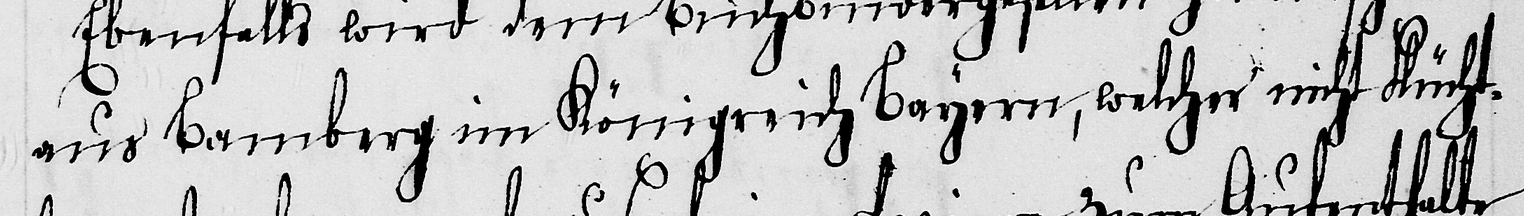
aus Bamberg im Königreich Bayern, welcher nicht Flücht¬
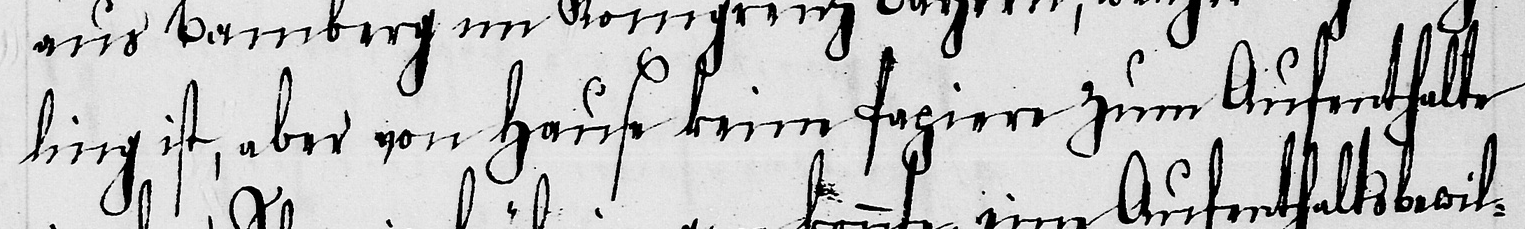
ling ist, aber von Hause keine Papiere zum Aufenthalte
